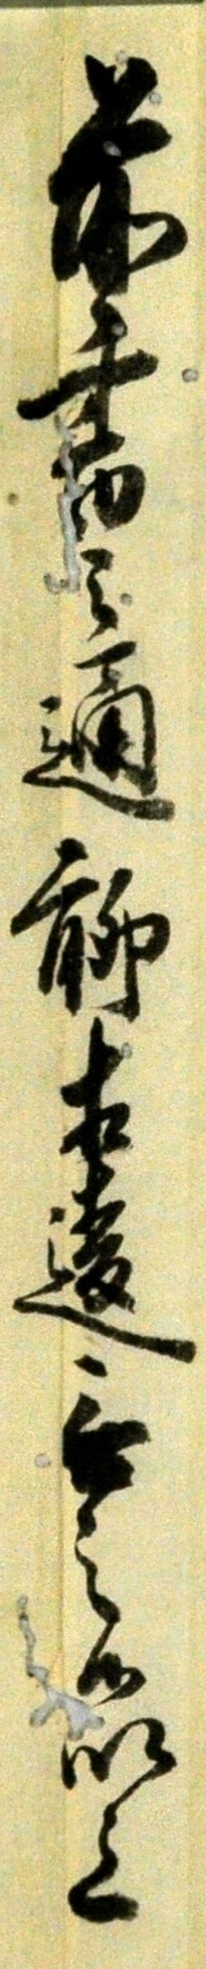前書之通聊相違無之候以上
